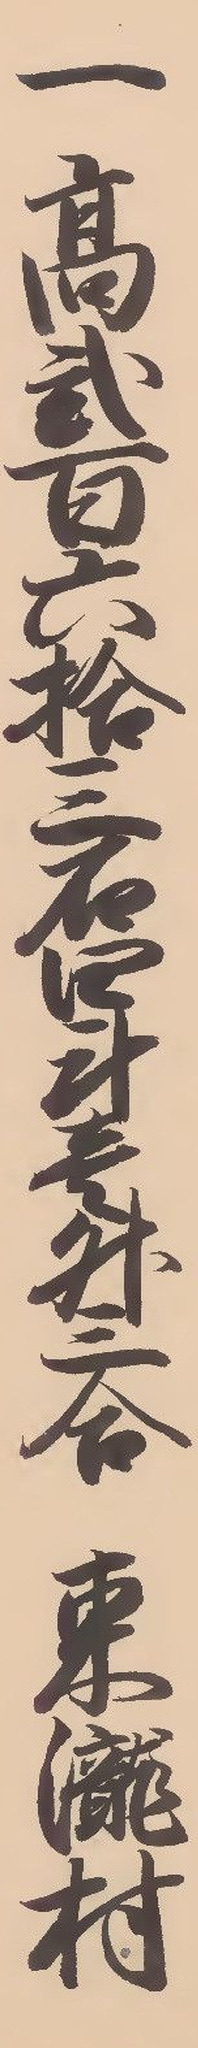一高弐百六拾三石四斗壱升三合東滝村

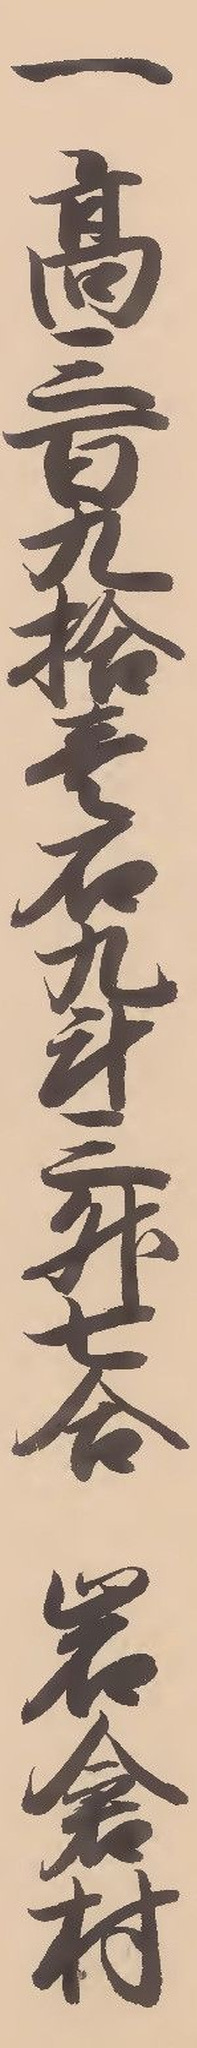一高三百九拾壱石九斗三升七合岩倉村
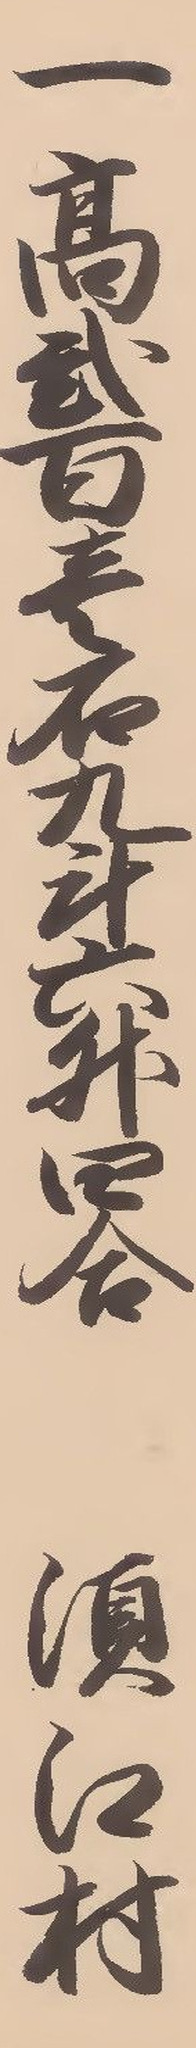一高弐百壱石九斗六升四合須江村
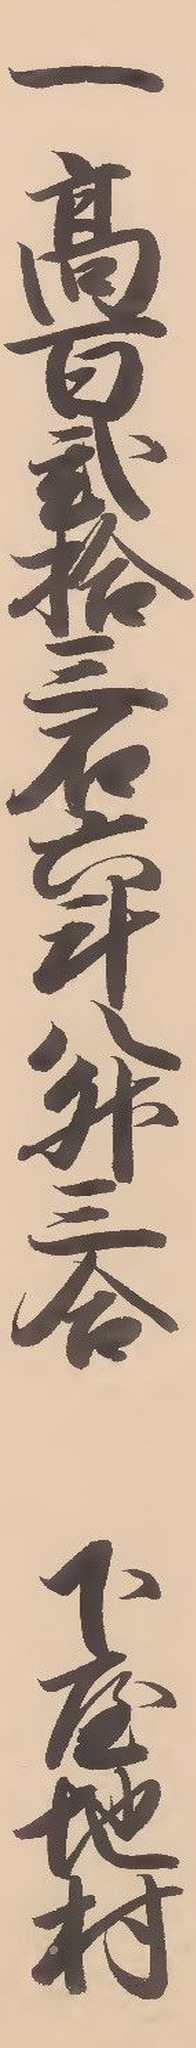一高百弐拾三石六斗八升三合下屋地村
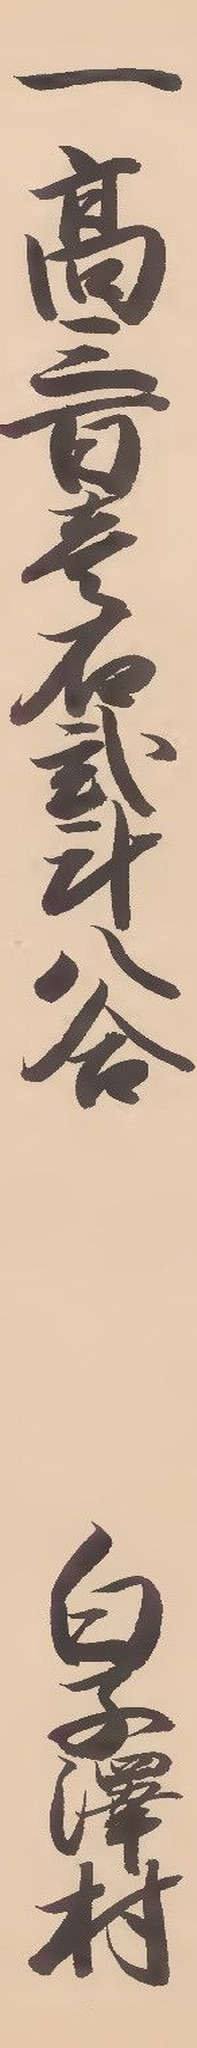一高三百壱石弐斗八合白子沢村
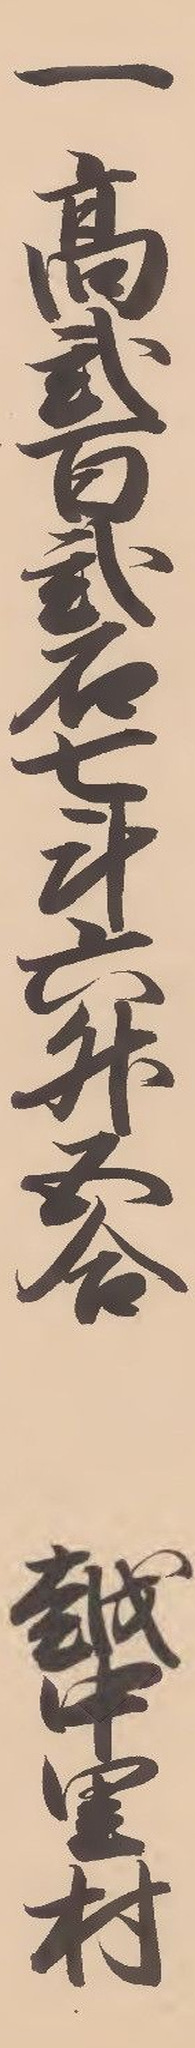一高弐百弐石七斗六升五合越中里村
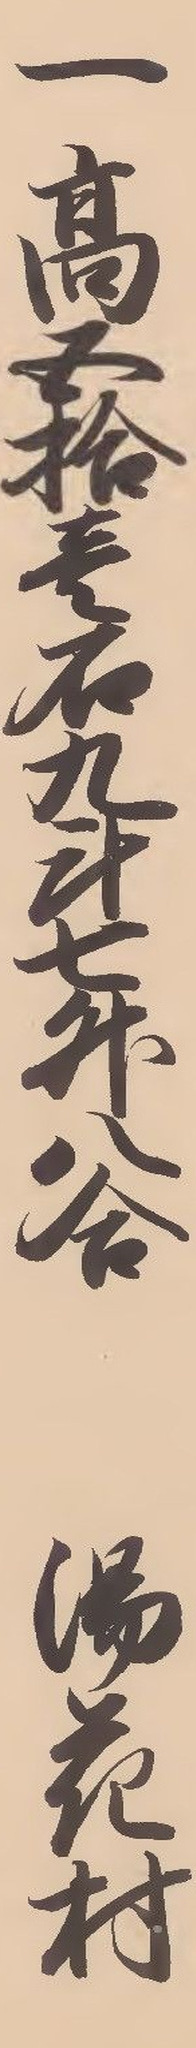一高五拾壱石九斗七升八合湯花村
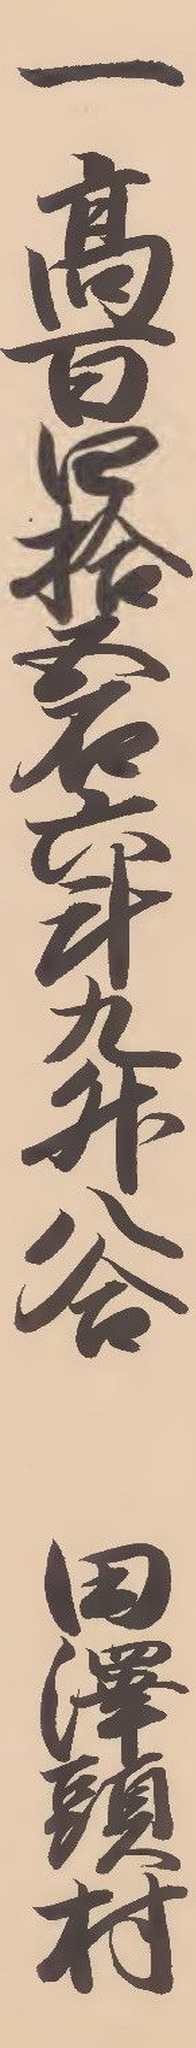一高百四拾五石六斗九升八合田沢頭村
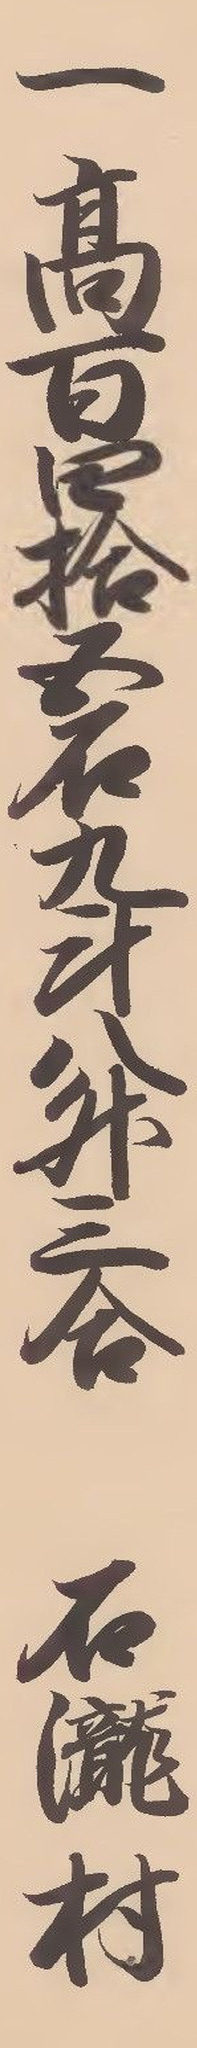一高百四拾五石九斗八升三合石滝村

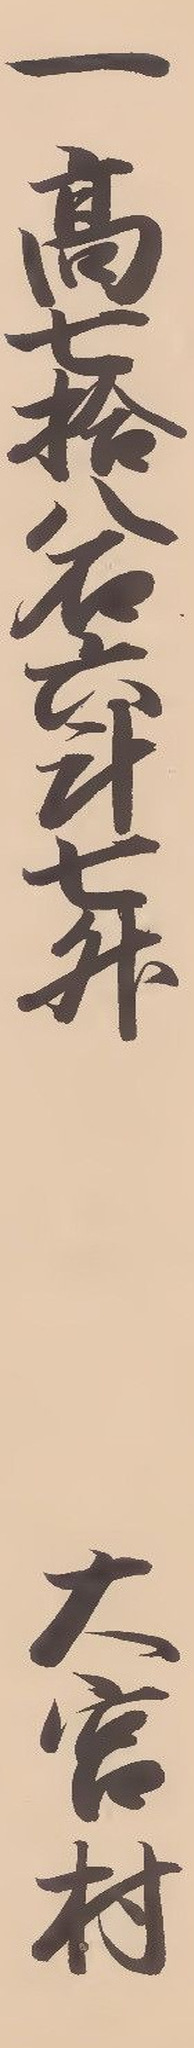一高七拾八石六斗七升大宮村
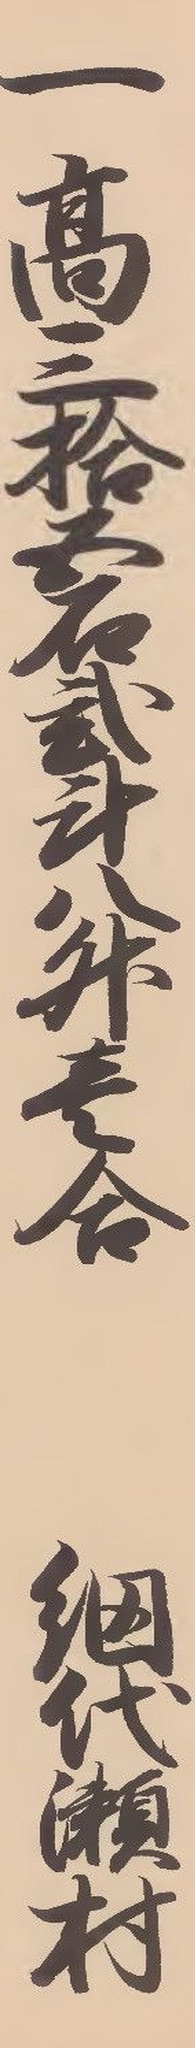一高三拾五石弐斗八升壱合細代瀬村
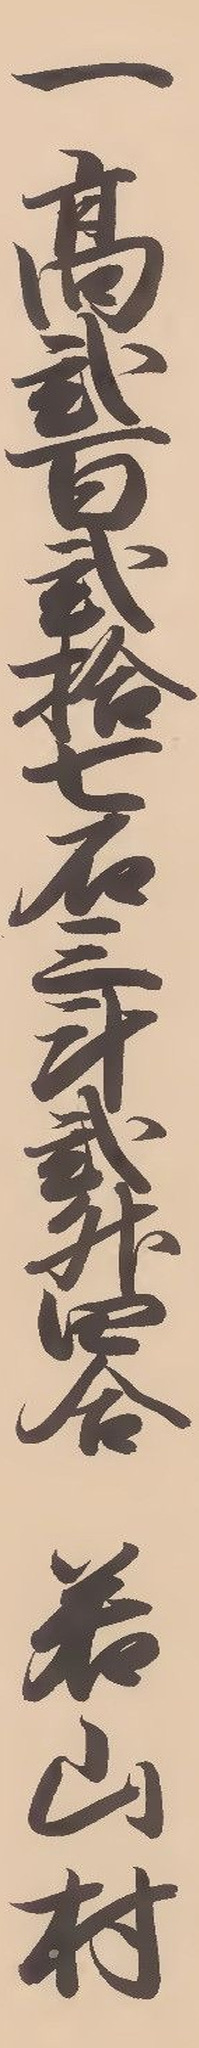一高弐百弐拾七石三斗弐升四合若山村
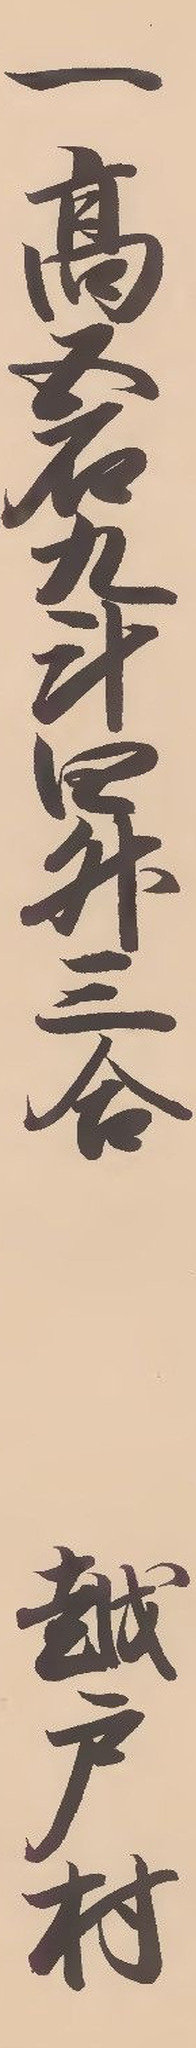一高五石九斗四升三合越戸村
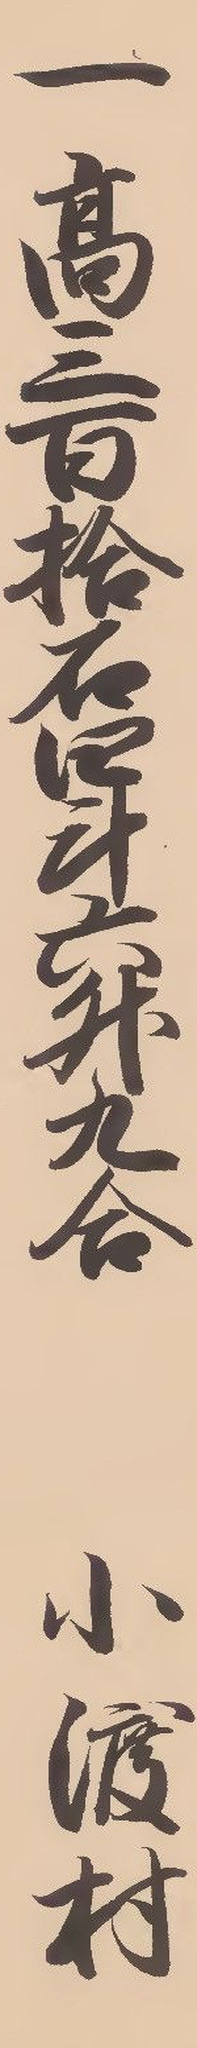一高三百拾石四斗六升九合小渡村
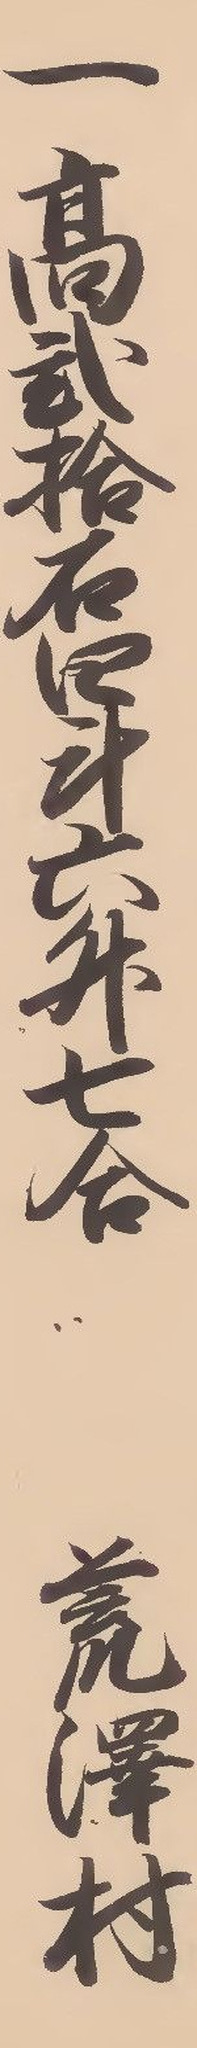一高弐拾石四斗六升七合荒沢村
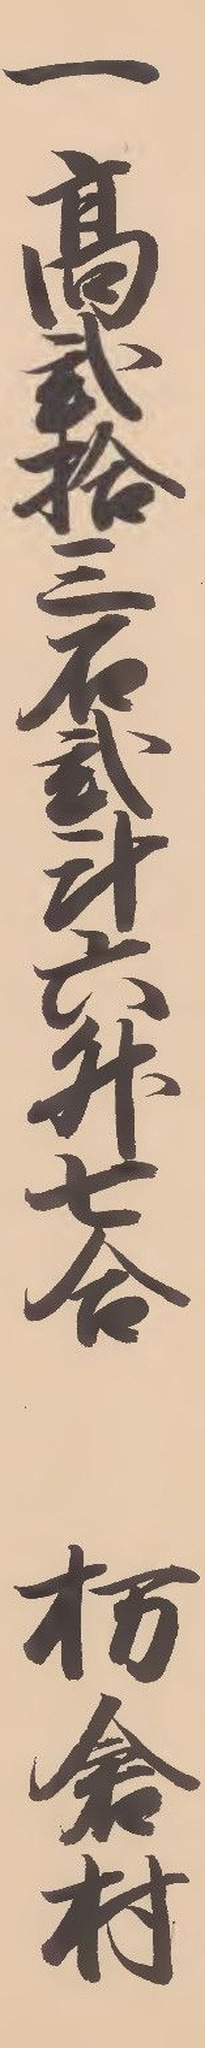一高弐拾三石弐斗六升七合栃倉村
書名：出羽国郷帳　１
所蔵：国立公文書館 National Archives of Japan
